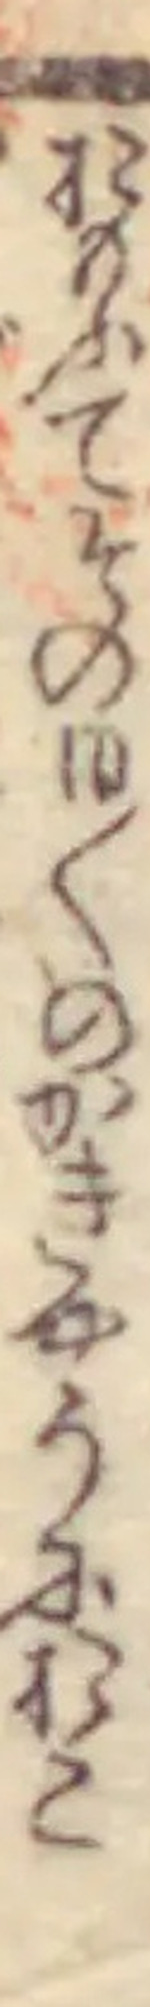おもふてその日〳〵のかきやうにおこ
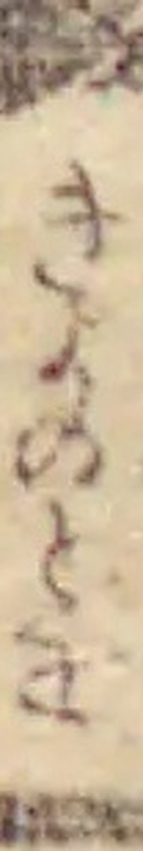きよのとを
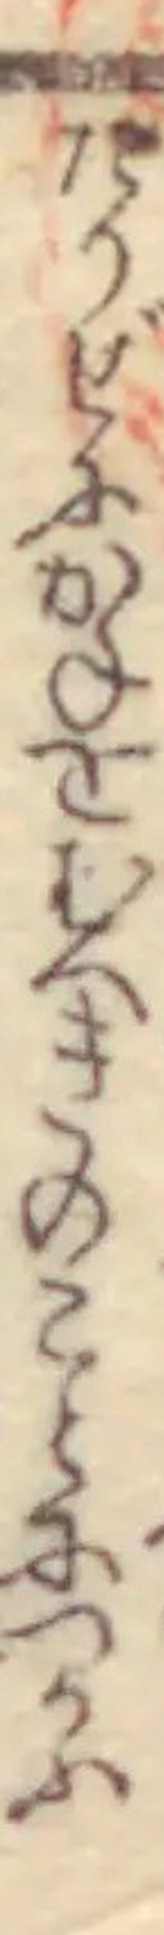たりぜにかねをむへきのことにつかふ
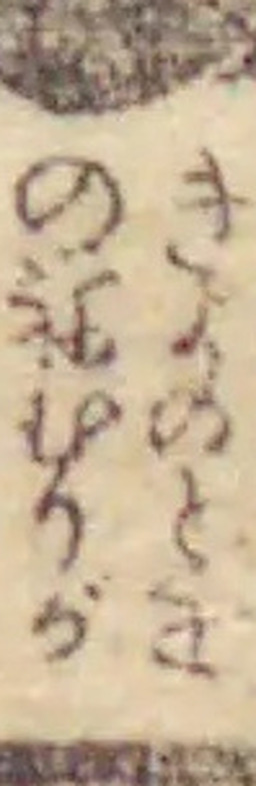のねむりが
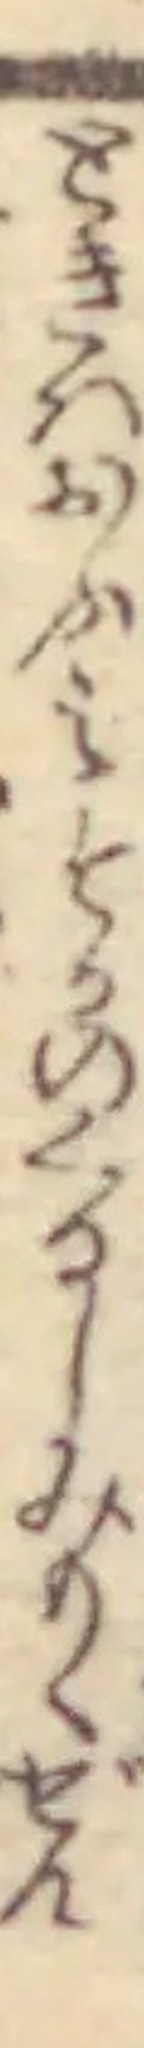ときはおふみそかのくるしみもくぜん
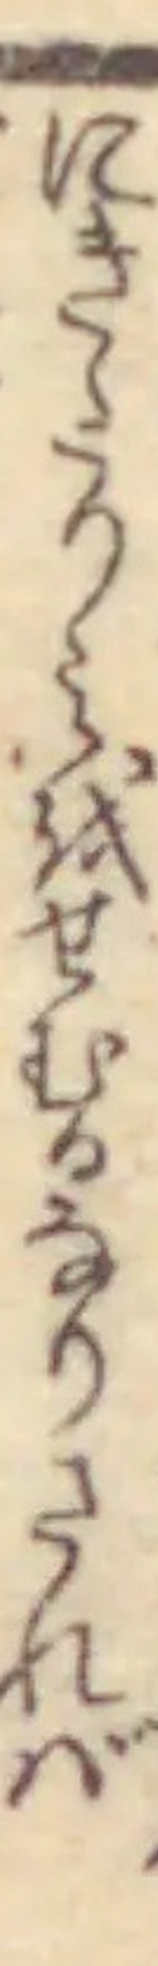にきたりみをせむるなりされば
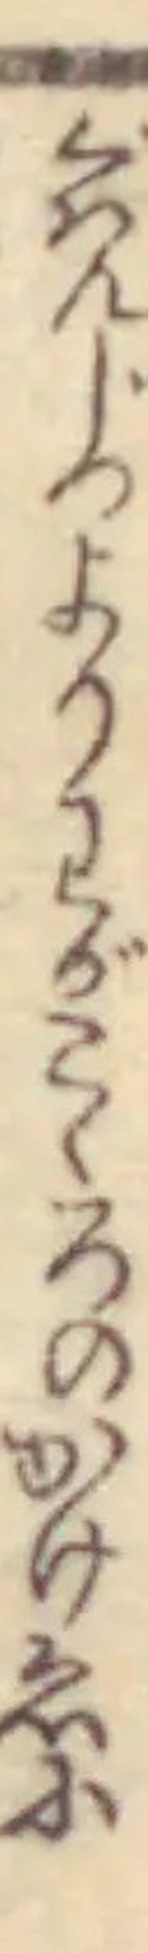ぐはんじつよりわがこゝろのかけゑに
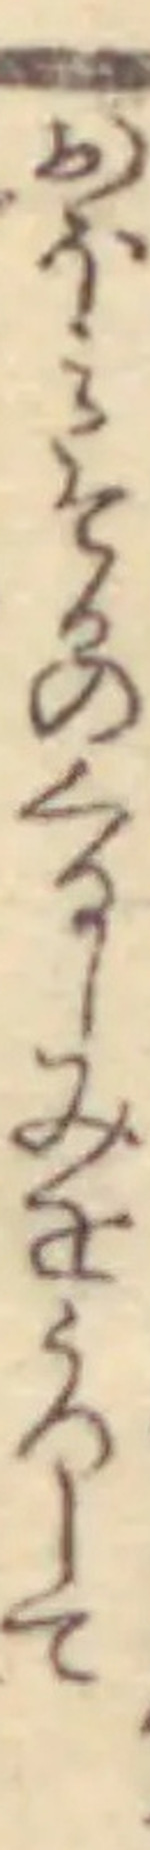おほみそかのくるしみをうつして
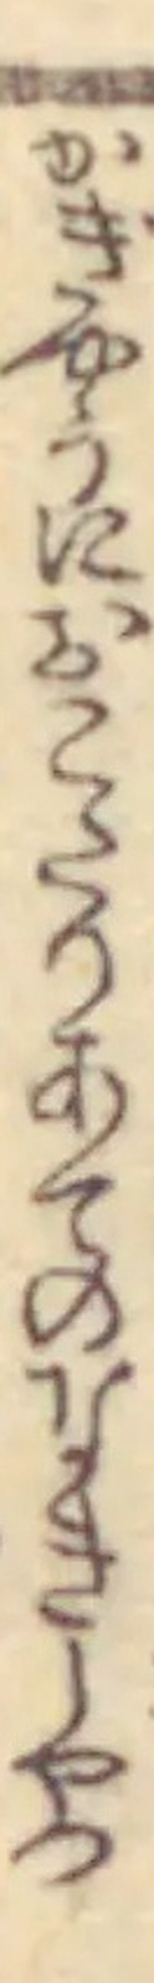かぎやうにおこたりあてなきしやつ
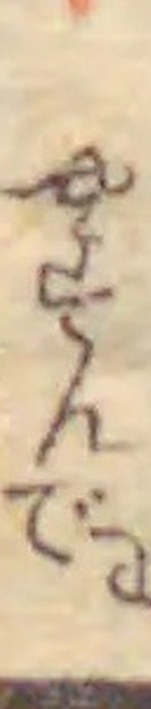やすんで
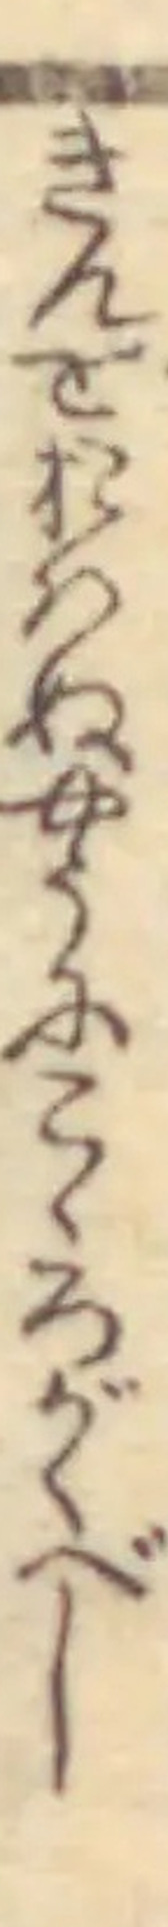きんをおはぬやうにこゝろがくべし
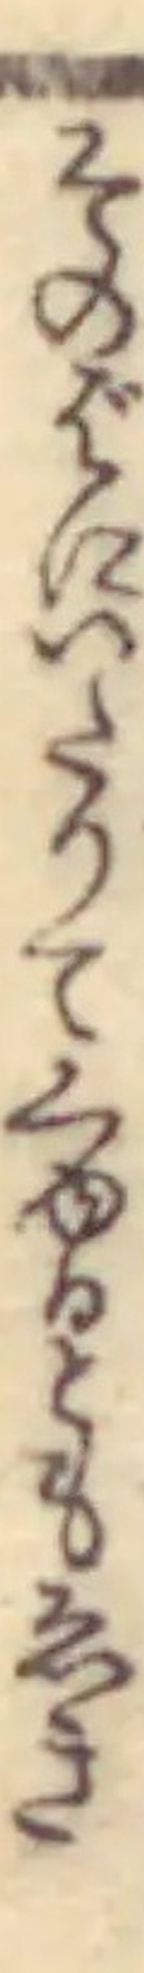そのばにいたりてくゆるともゑき
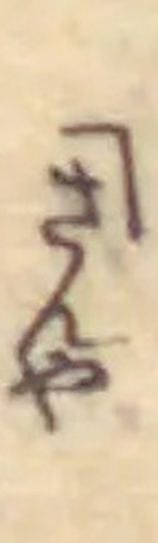乁さんや
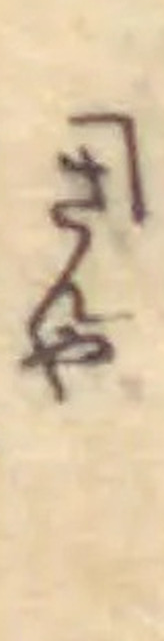乁さんや
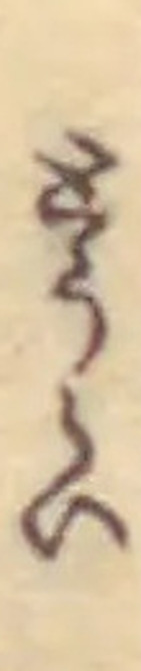とうらい
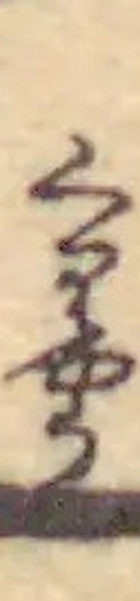くりやう
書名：児訓影絵喩 3巻
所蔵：国立国会図書館 National Diet Library, JAPAN
